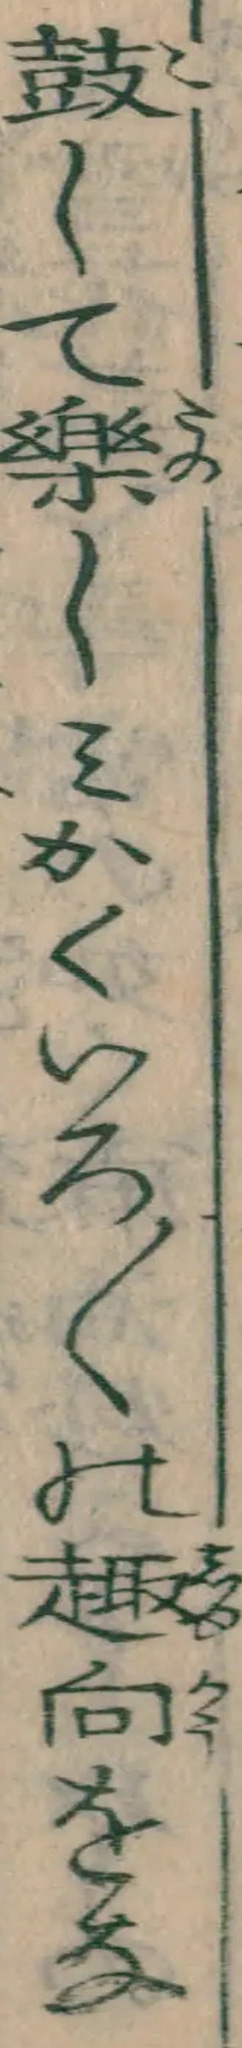鼓して楽しみかくいろ〳〵の趣向をな
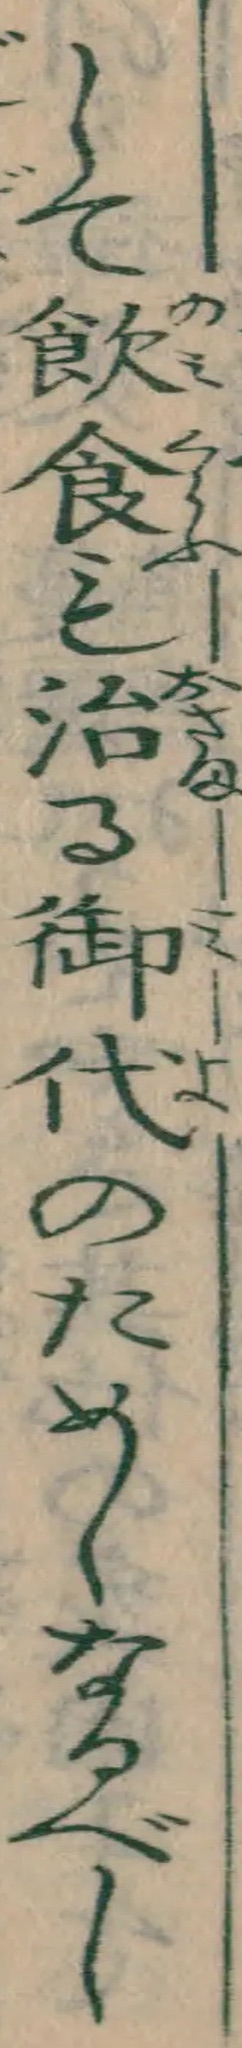して飲食も治る御代のためしなるべし
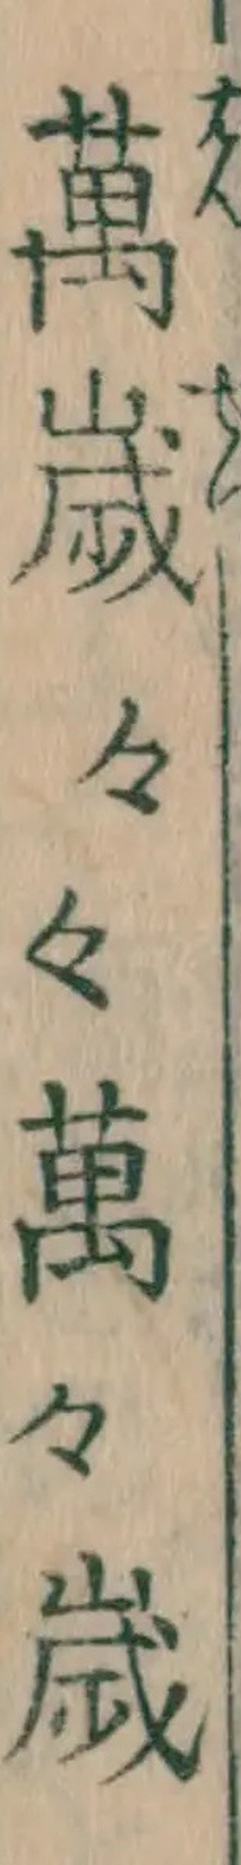万歳々々万々歳
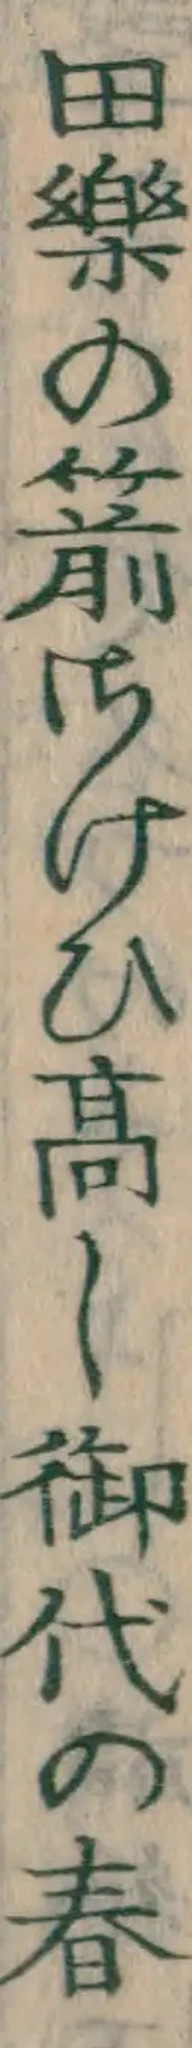田楽の箭さけひ高し御代の春

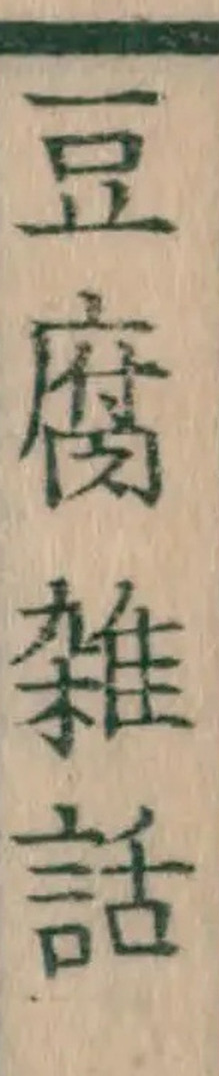豆腐雑話
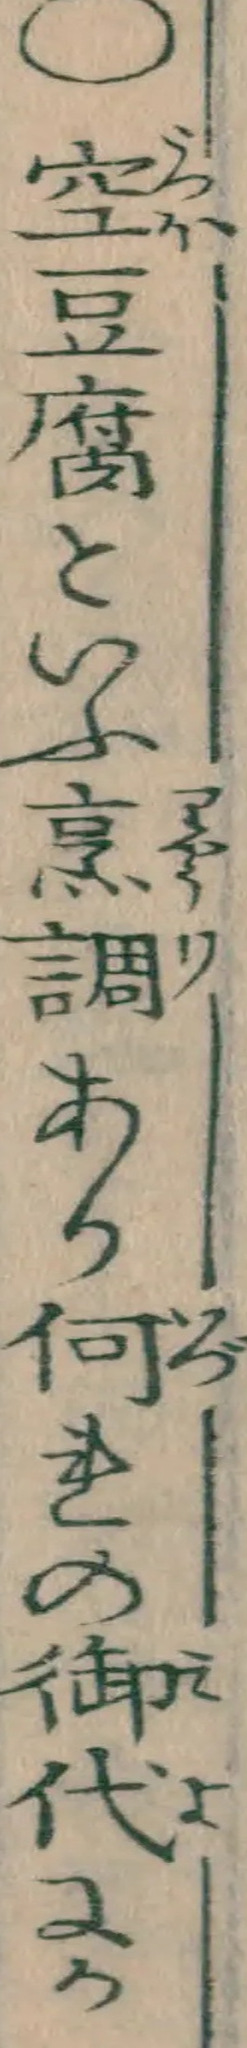○空豆腐といふ烹調あり何れの御代にか
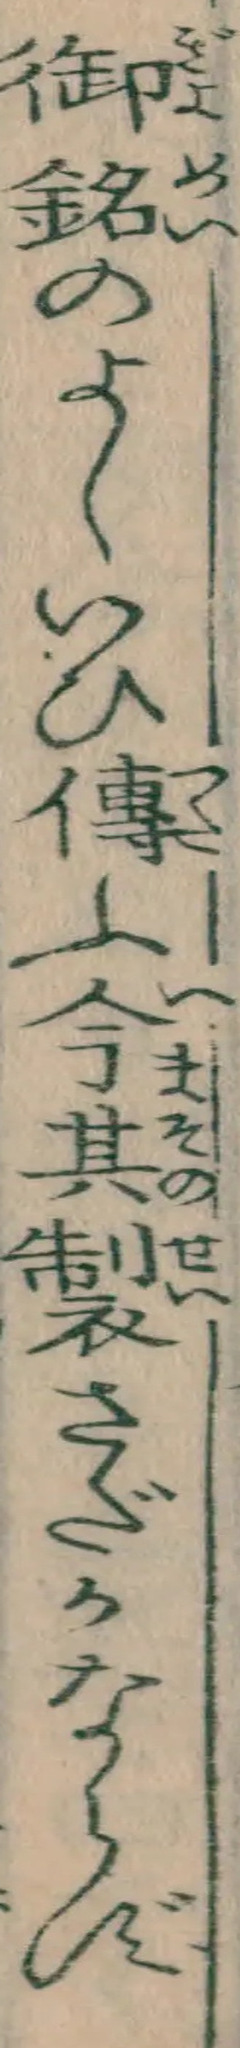御銘のよしいひ伝ふ今其製さだかならず
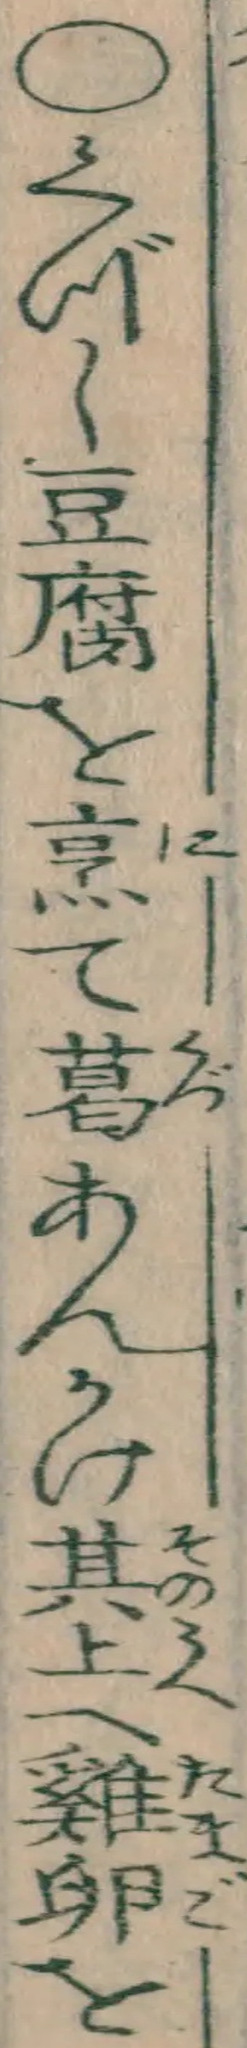○くづし豆腐を烹て葛あんかけ其上へ鶏卵を
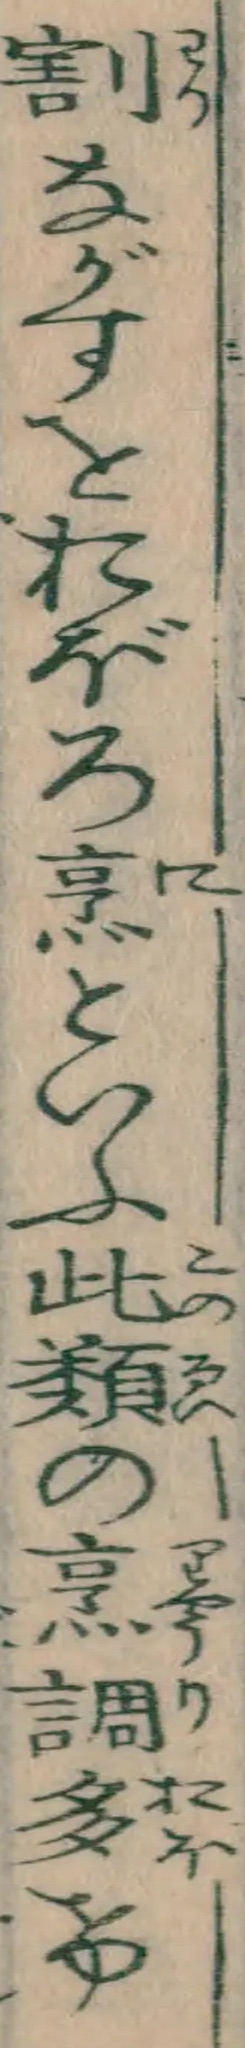割ながすをおぼろ烹といふ此類の烹調多け
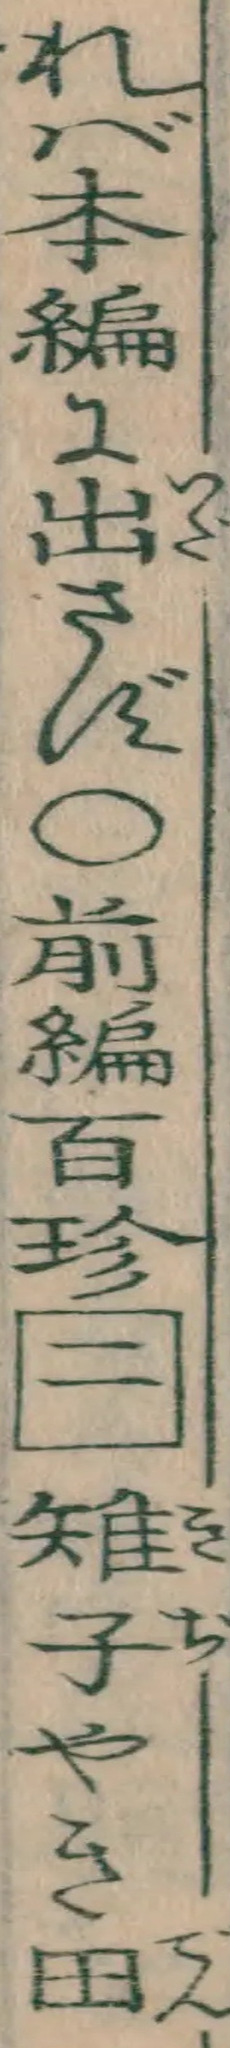れば本編に出さず○前編百珍二雉子やき田
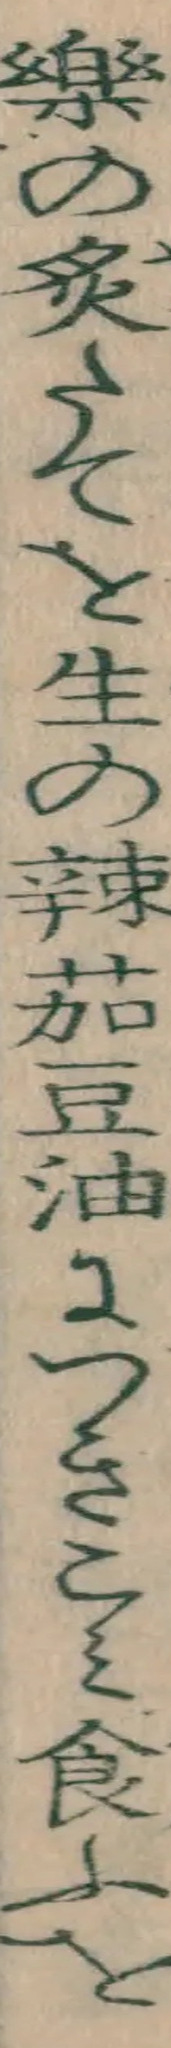楽の炙たてを生の辣茄豆油につきこみ食ふを
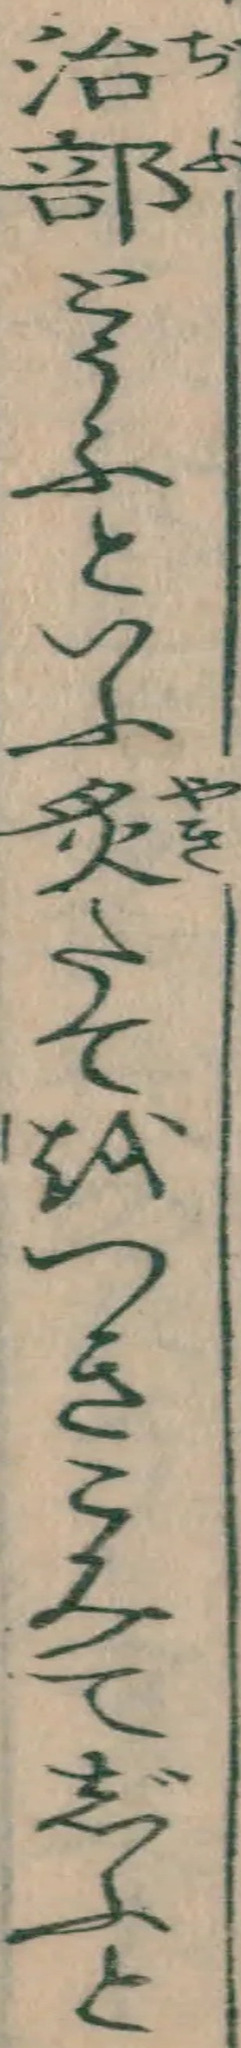治部とうふといふ炙たてをつきこみてじぶと
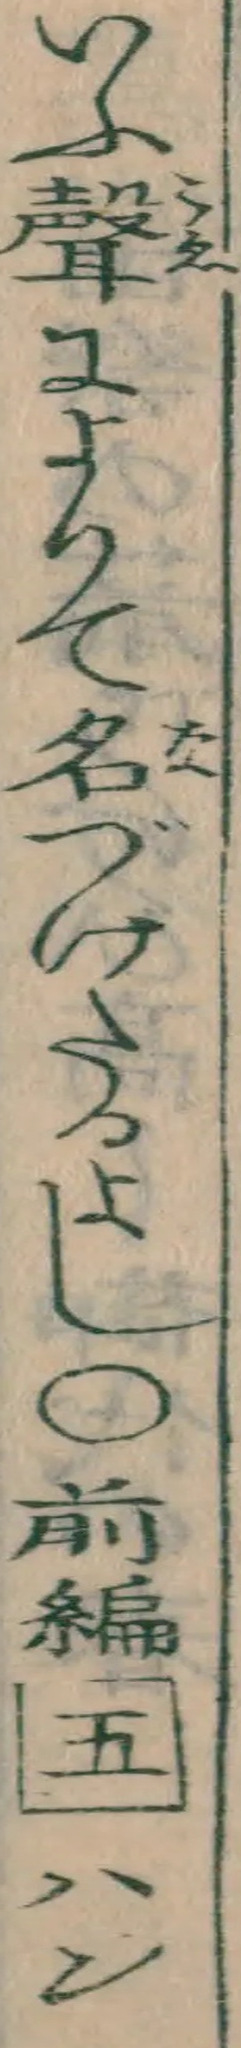いふ声によりて名づけたるよし○前編五ハン
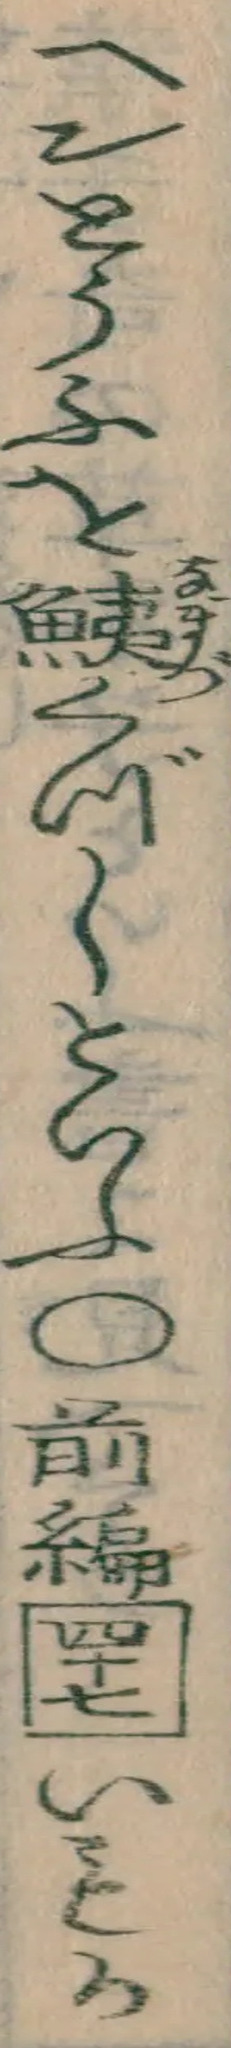ヘンとうふを鮧くづしといふ○前編四十七いもか
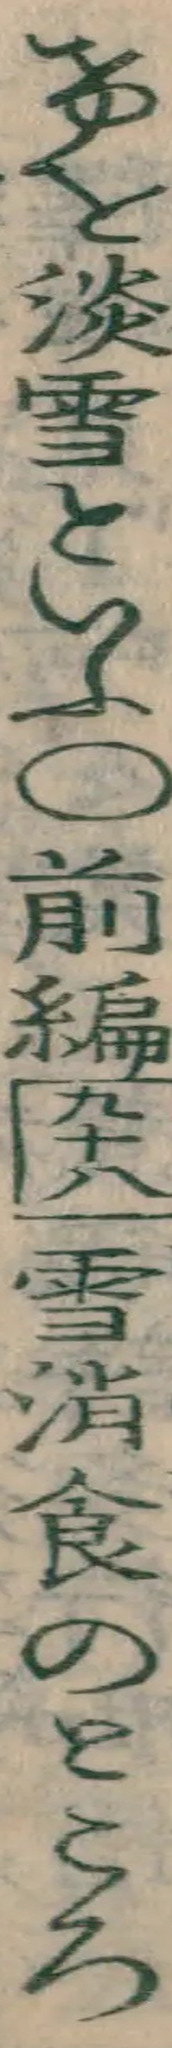けを淡雪といふ○前編九十八雪消食のところ
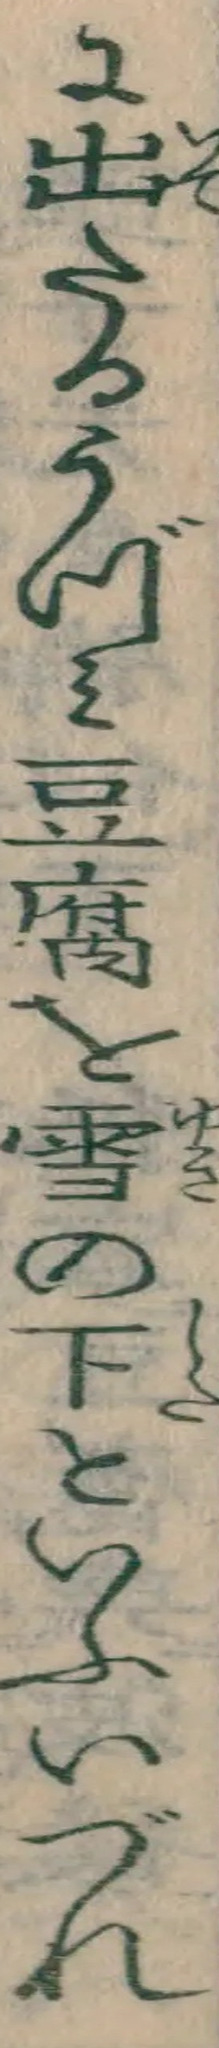に出たるうづみ豆腐を雪の下といふいづれ
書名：豆腐百珍. 続編
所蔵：国立国会図書館 National Diet Library, JAPAN
